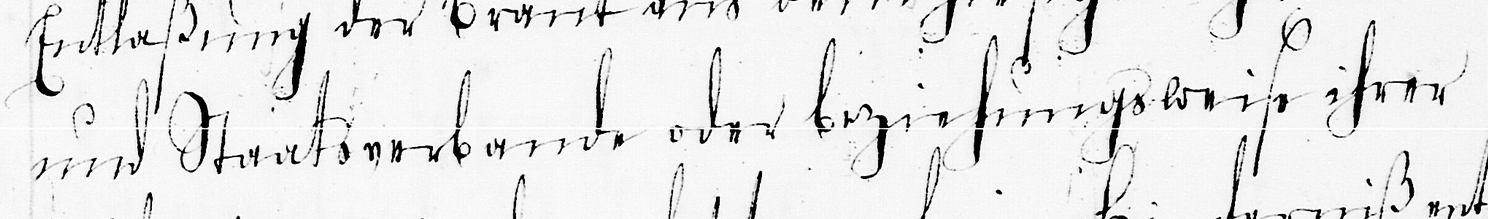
und Staatsverbande oder beziehungsweise ihrer
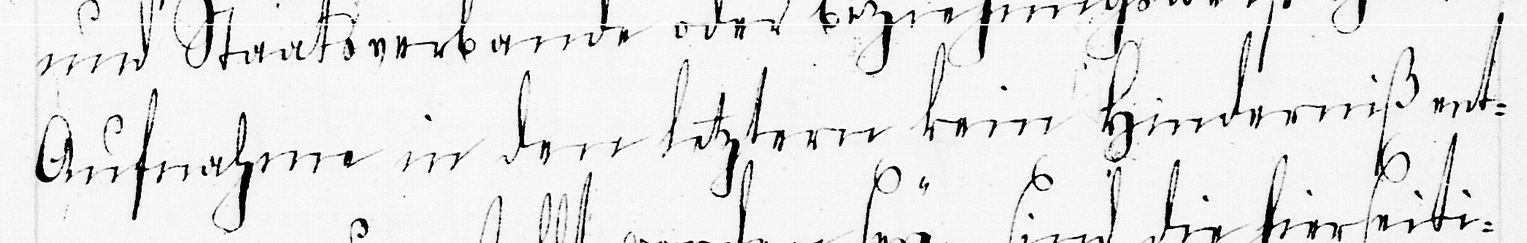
Aufnahme in den letztern kein Hinderniß ent¬
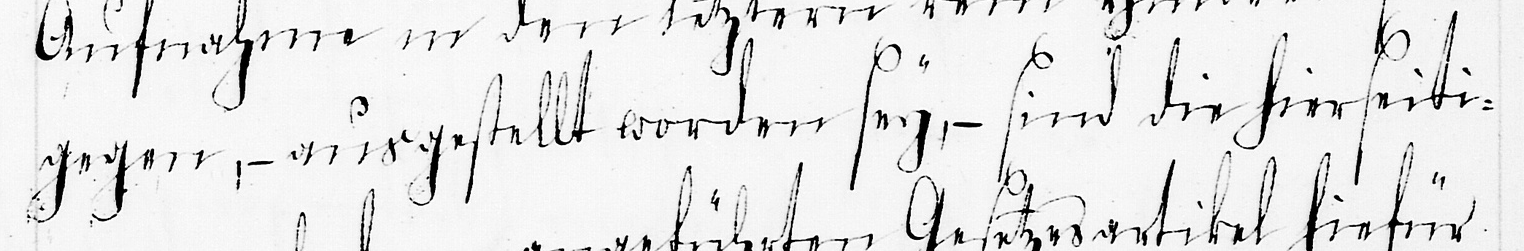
gegen, – ausgestellt worden sey, – sind die hierseiti¬
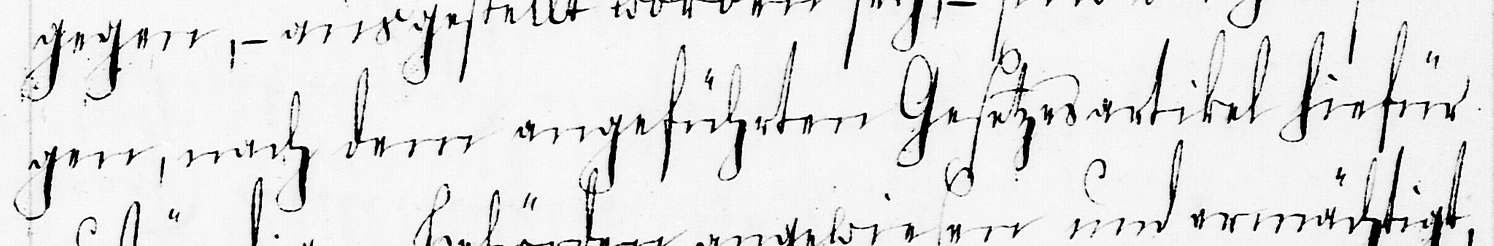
gen, nach dem angeführten Gesetzesartikel hiefür
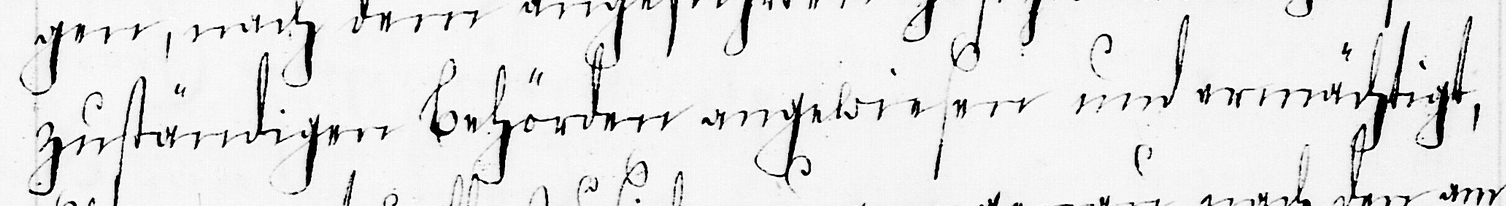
zuständigen Behörden angewiesen und ermächtigt,
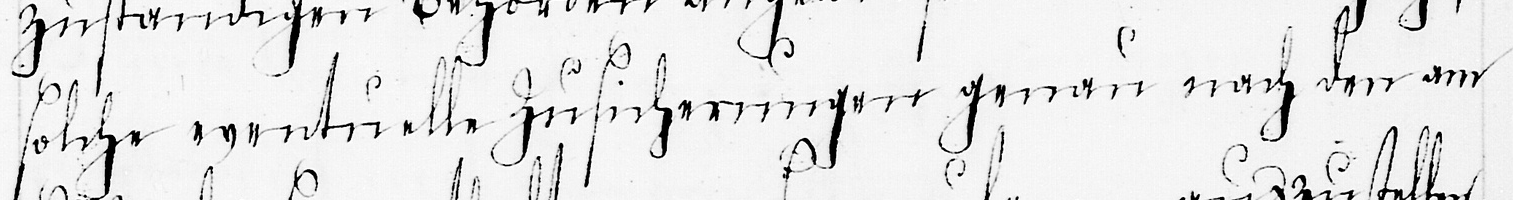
solche eventuelle Zusicherungen genau nach den am
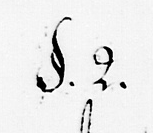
§. 2.
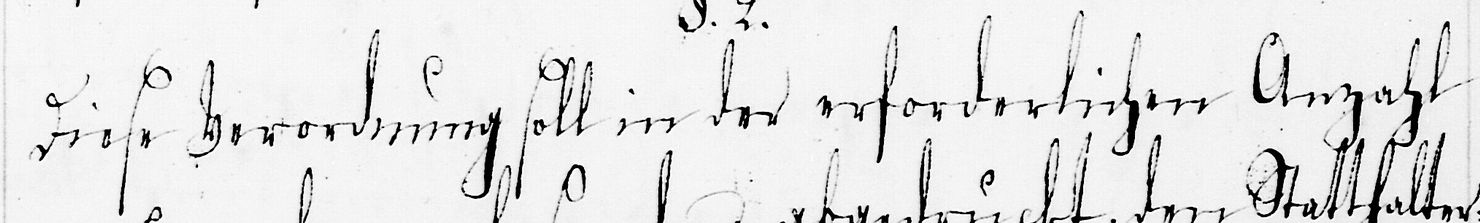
Diese Verordnung soll in der erforderlichen Anzahl
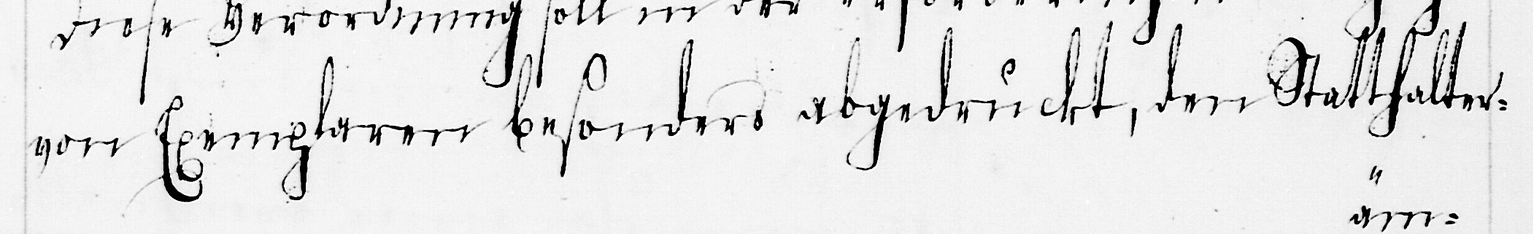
von Exemplaren besonders abgedruckt, den Statthalter-
